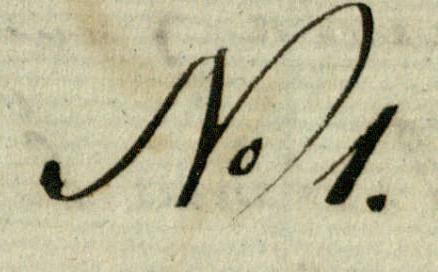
Nº 1.
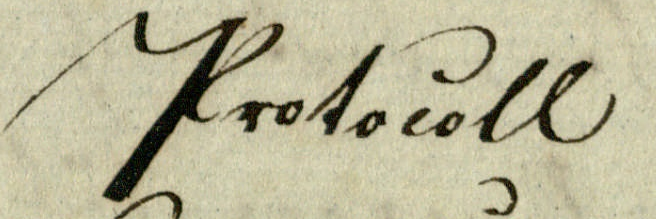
Protocoll
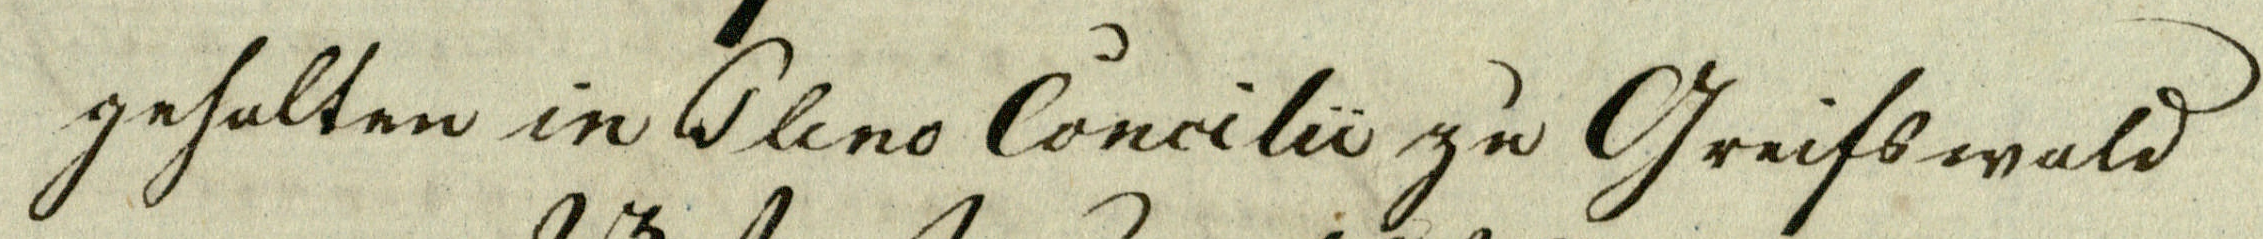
gehalten in Pleno Concilii zu Greifswald
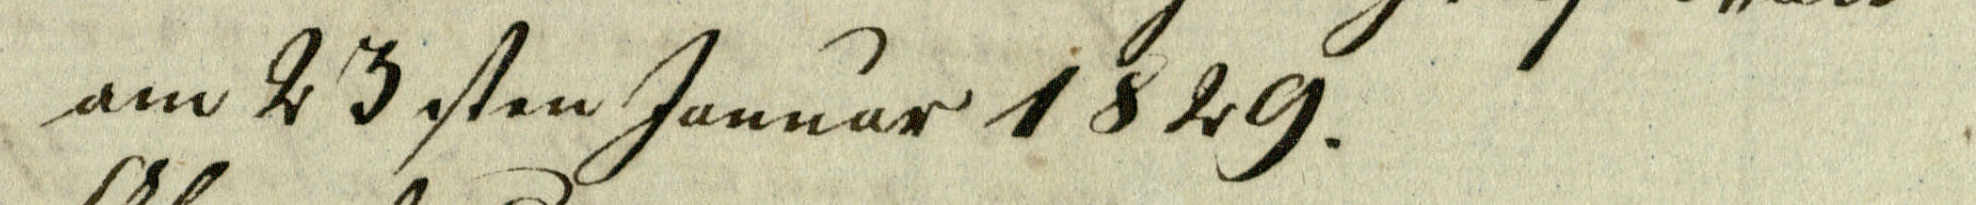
am 23ten Januar 1829
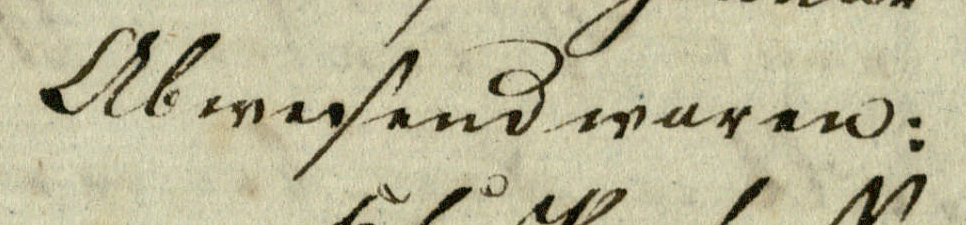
Abwesend waren:
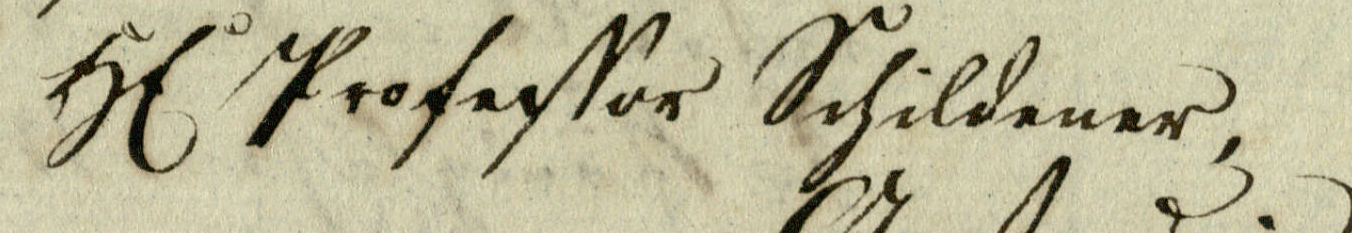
HE Professor Schildener,
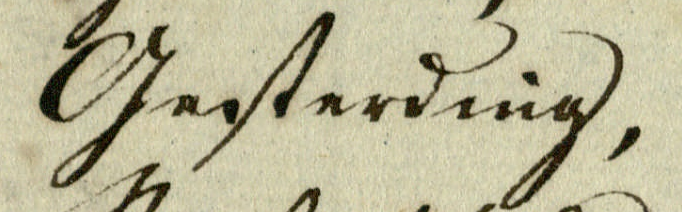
Gesterding,
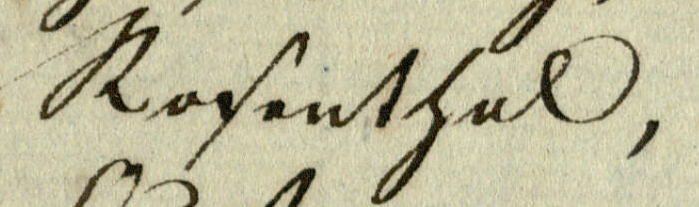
Rosenthal,
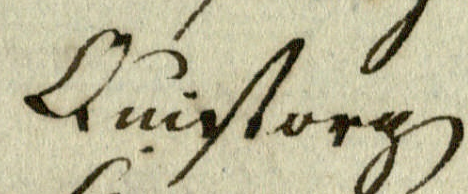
Quistorp,
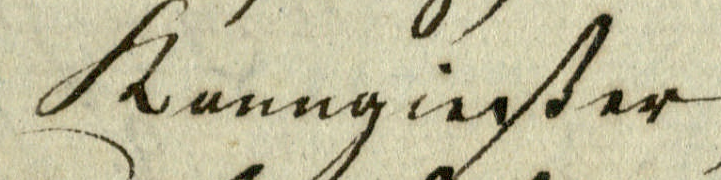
Kanngießer,
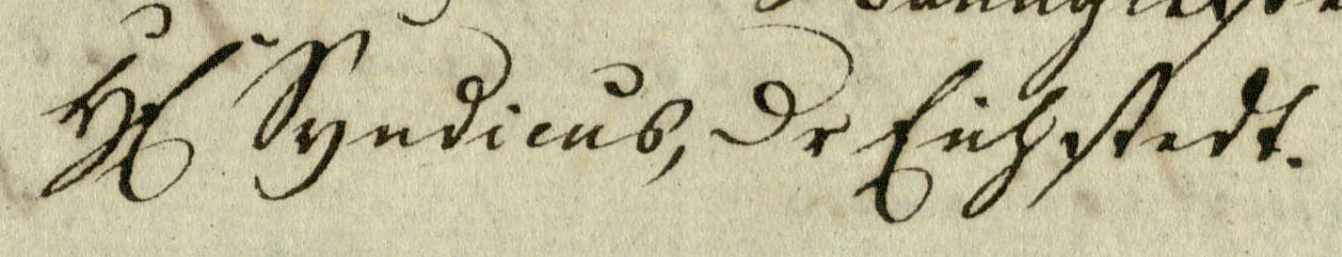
HE Syndicus, Dr Eichstedt.
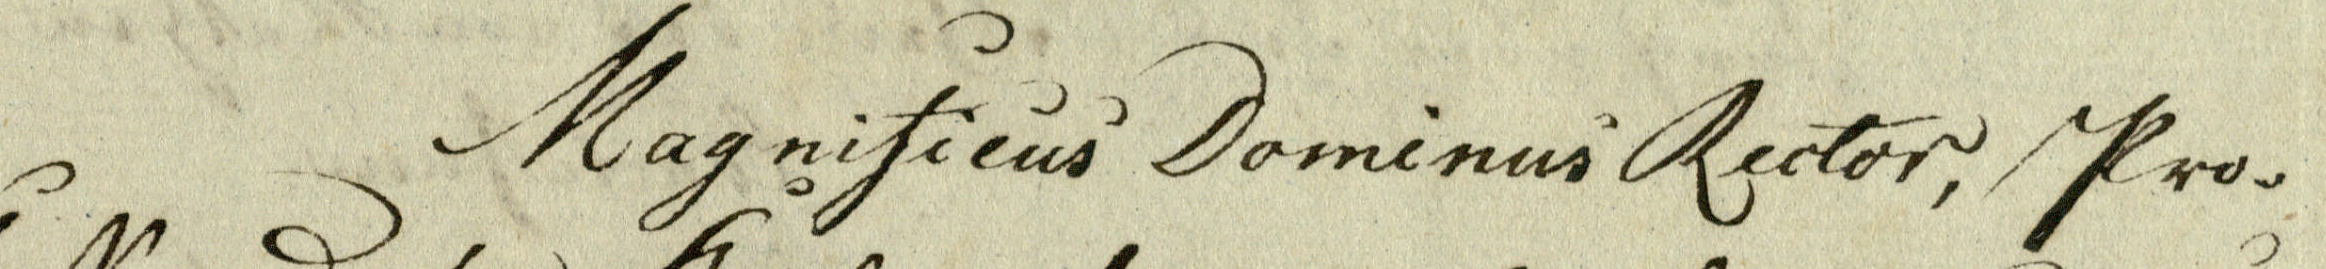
Magnificus Dominus Rector, Pro¬
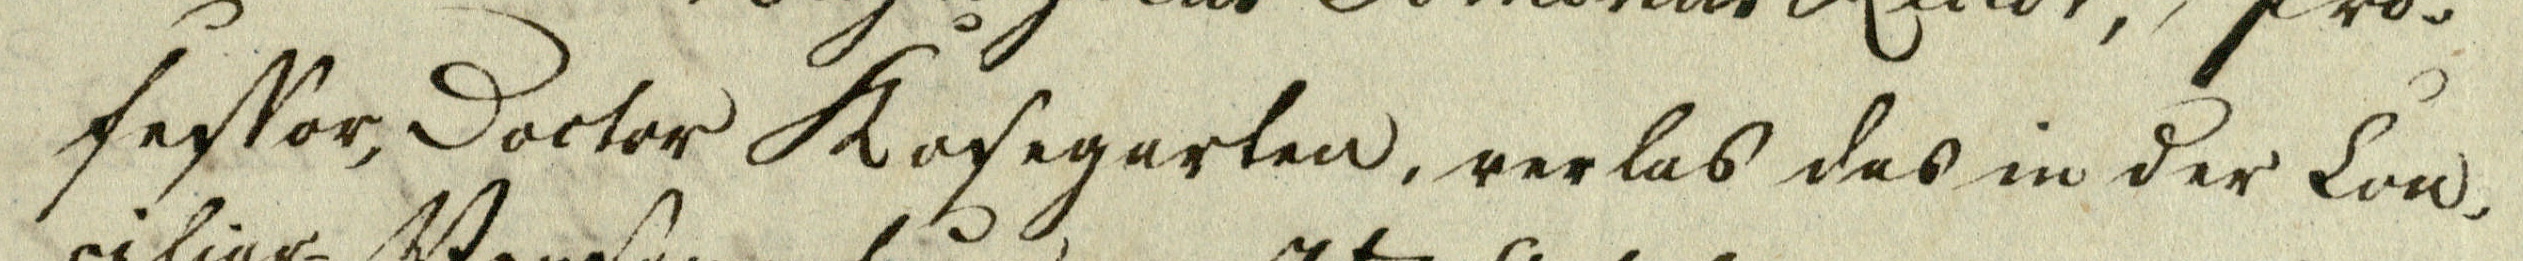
fessor, Doctor Kosegarten, verlas das in der Con¬
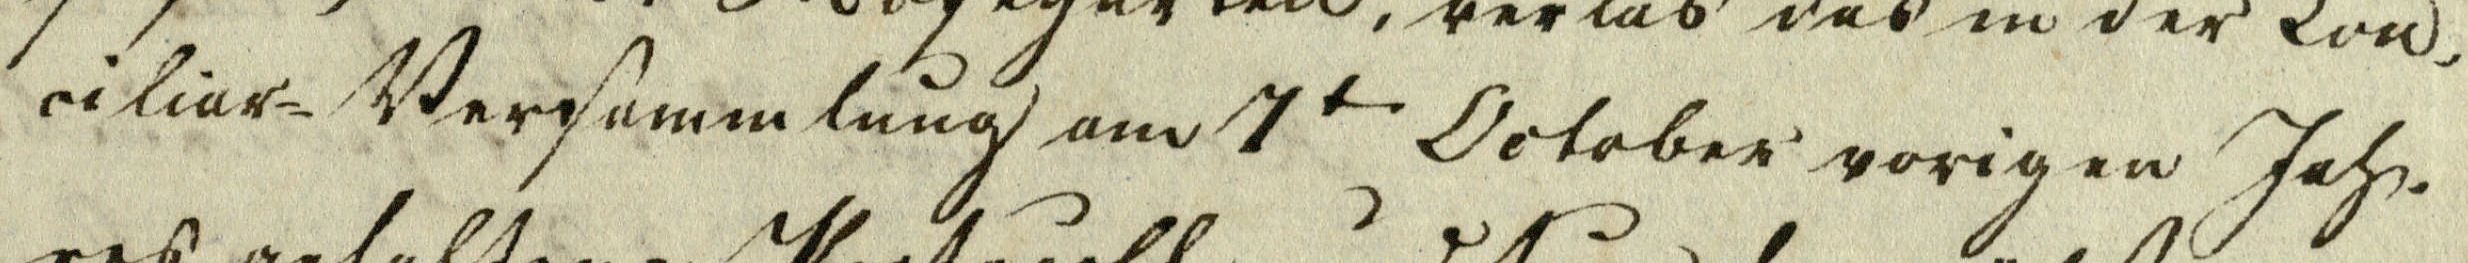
ciliar-Versammlung am 7ten October vorigen Jah¬
